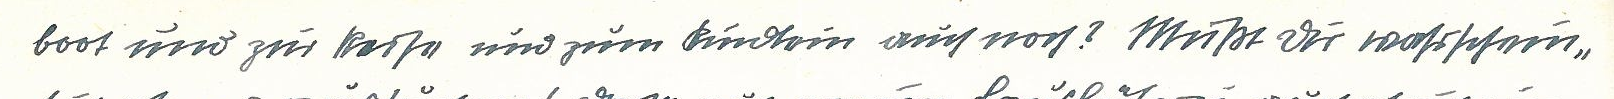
boot und zur Reise und zum Kindlein auch noch? Mußt Dir wahrschein¬
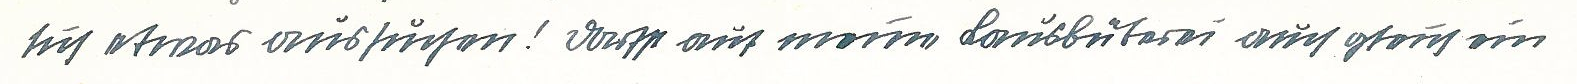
lich etwas aussuchen! [Du] Darfst auf meine Lausbüberei auch gleich ein
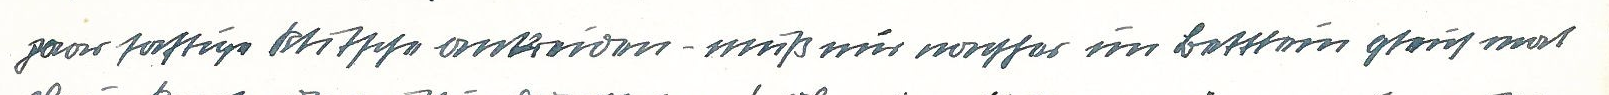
paar saftige Klitsche ankreiden – muß mir nachher im Bettlein gleich mal
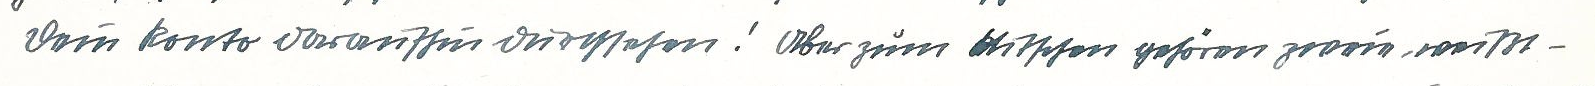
Dein Konto daraufhin durchsehen! Aber zum Klitschen gehören zwei, weißt –
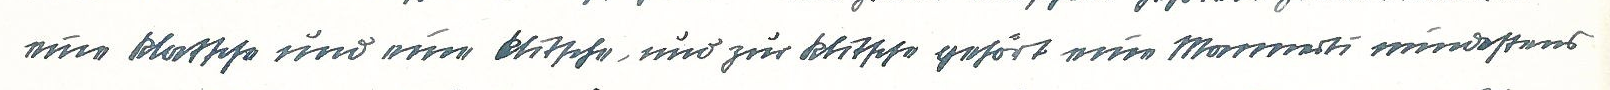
eine Klatsche und eine Klitsche, und zur Klitsche gehört ein Mannerli mindestens
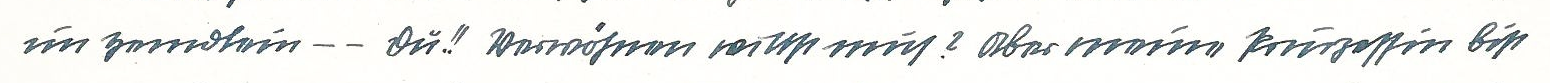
im Hemdlein – – Du!! Verwöhnen willst [Du] mich? Aber meine Prinzessin bist
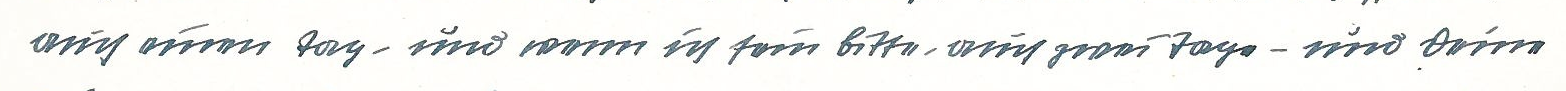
auch einen Tag, und wenn ich fein bitte, auch zwei Tage – und Deine
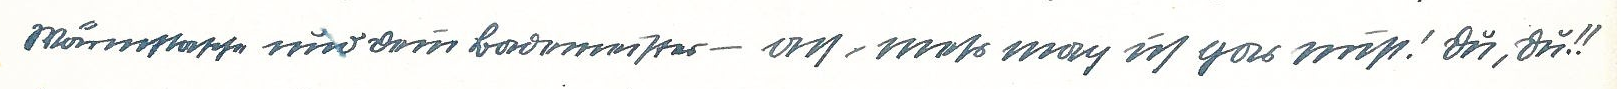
Wärmflasche und Dein Bademeister – ach, mehr mag ich gar nicht! Du!, Du!!
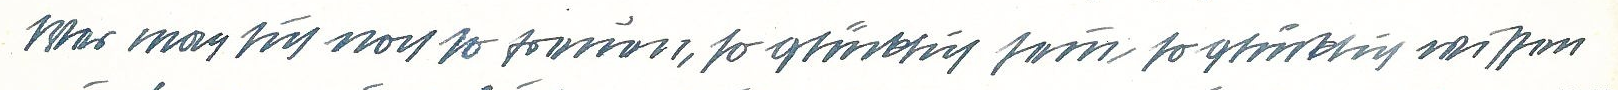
Wer mag sich noch so freuen, so glücklich sein, so glücklich wissen
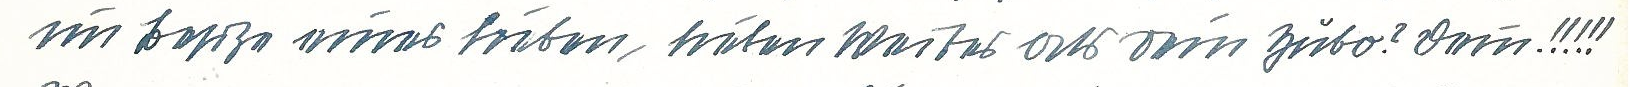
im Besize eines lieben, lieben Weibes als Dein Hubo? Dein!!!!!
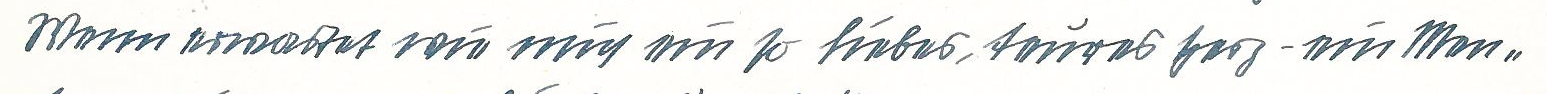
Wenn erwartet wie mich ein so liebes teures Herz – ein Men¬
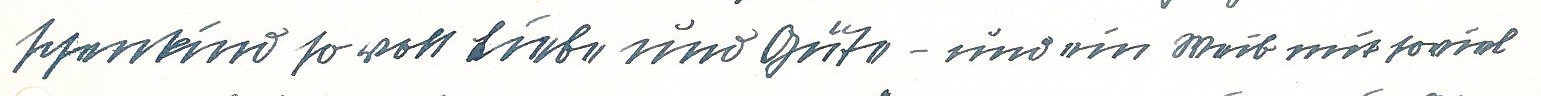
schenkind so voll Liebe und Güte – und ein Weib mit so viel
